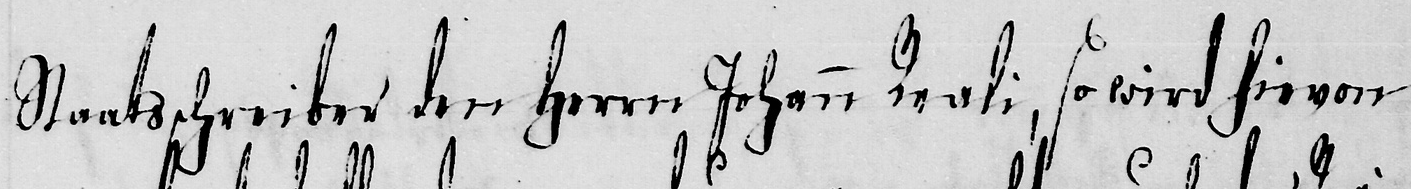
taatsschreiber den Herrn Johann Reali, so wird hievon
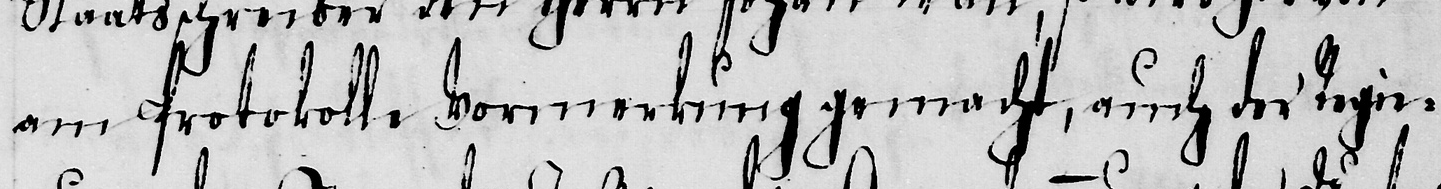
am Protokolle Vormerkung gemacht, auch der Regie¬
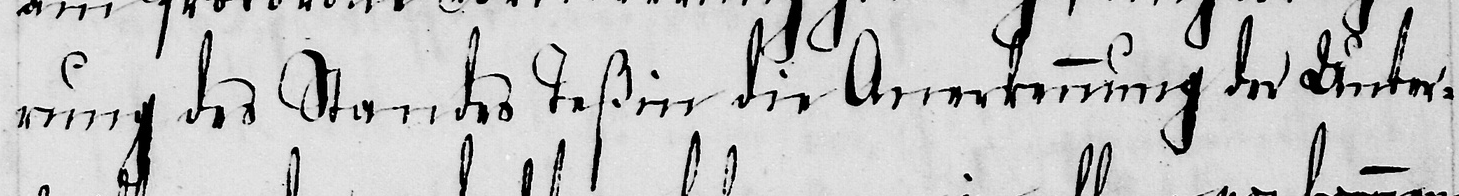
rung des Standes Teßin die Anerkennung der Unter¬
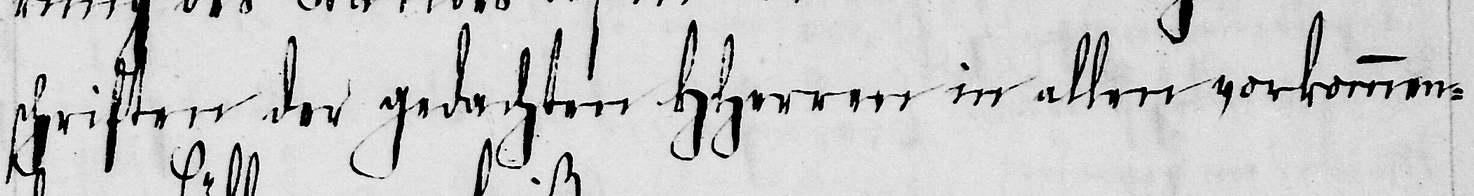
schriften der gedachten HHerren in allen vorkommen¬
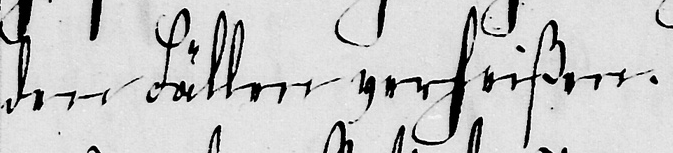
den Fällen verheißen.
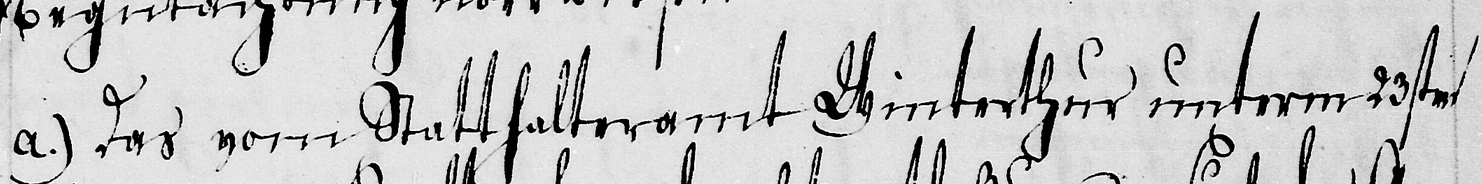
a.) Das vom Statthalteramt Winterthur unterm 23sten
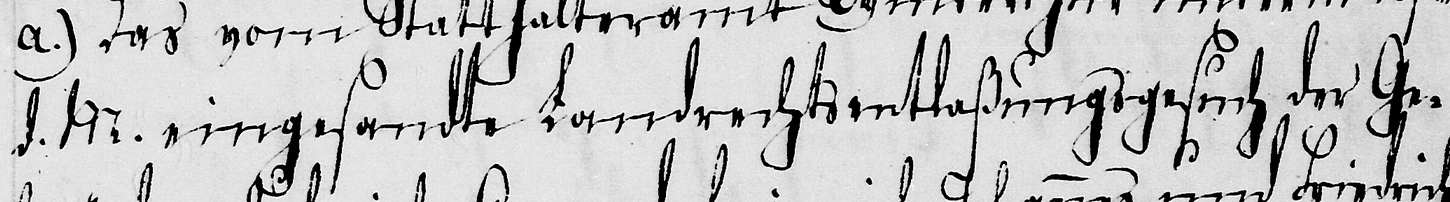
d. M. eingesandte Landrechtsentlaßungsgesuch der Ge¬
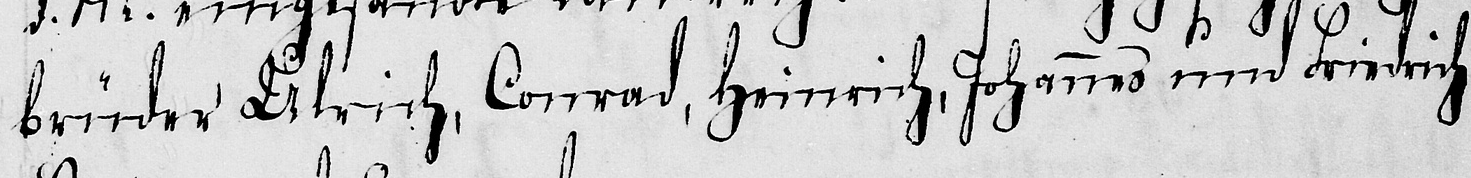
brüder Ulrich, Conrad, Heinrich, Johannes und Friedrich
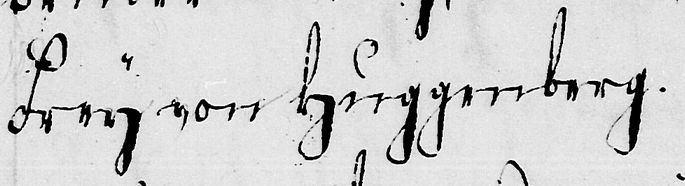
Frey von Huggenberg.
